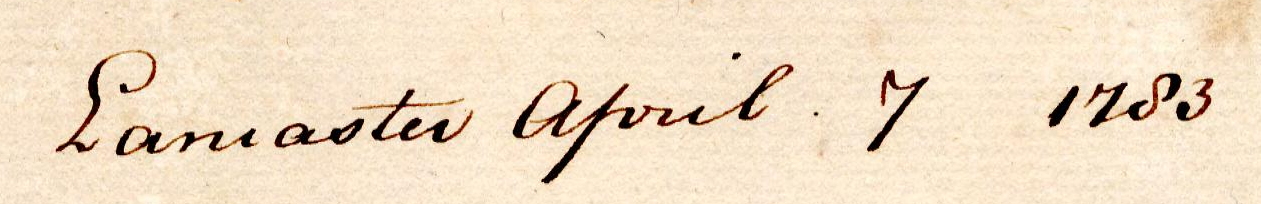Lancaster April. 7 1783
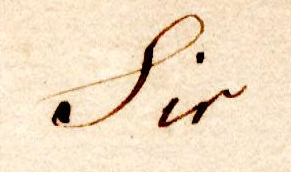Sir
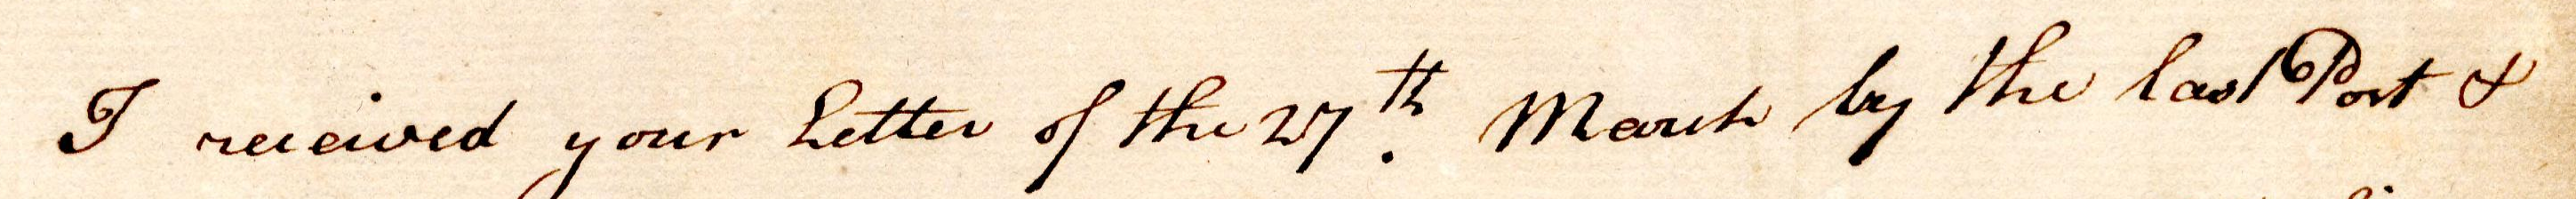I received your Letter of the 27^th March by the last Post &
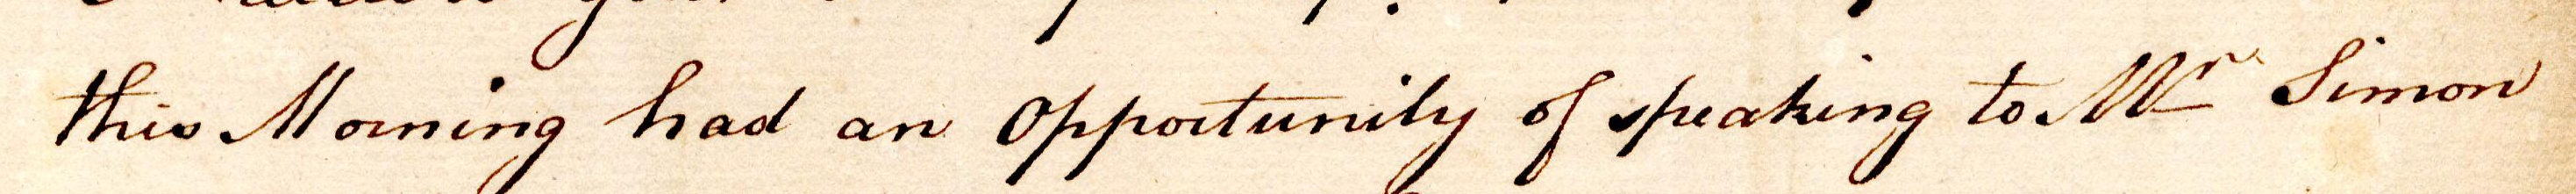this Morning had an opportunity of speaking to M^r Simon
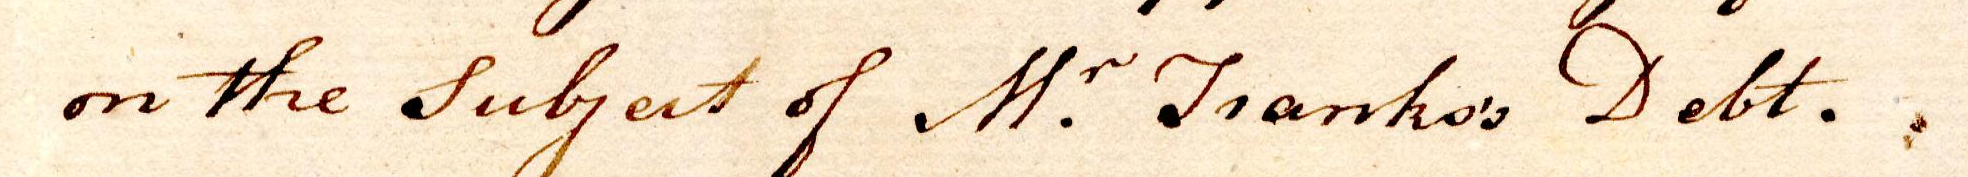on the Subject of M^r. Franks's Debt.
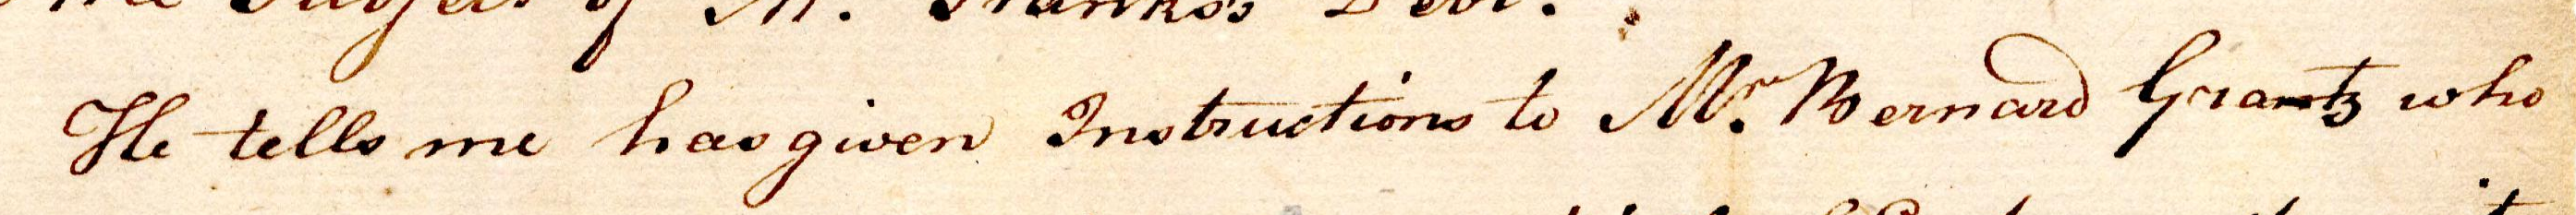He tells me has given Instructions to M^r. Bernard Grantz who
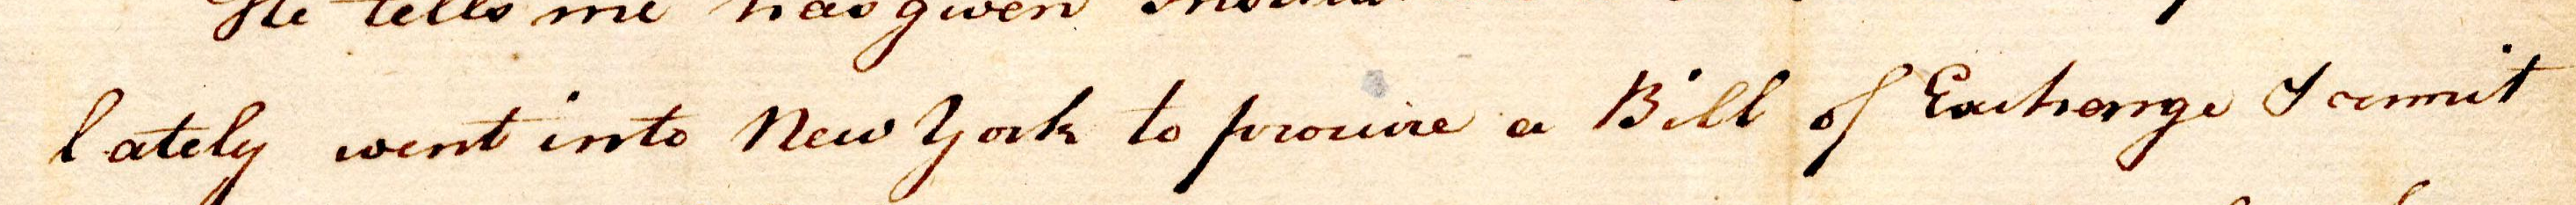lately went into New York to procure a Bill of Exchange & remit
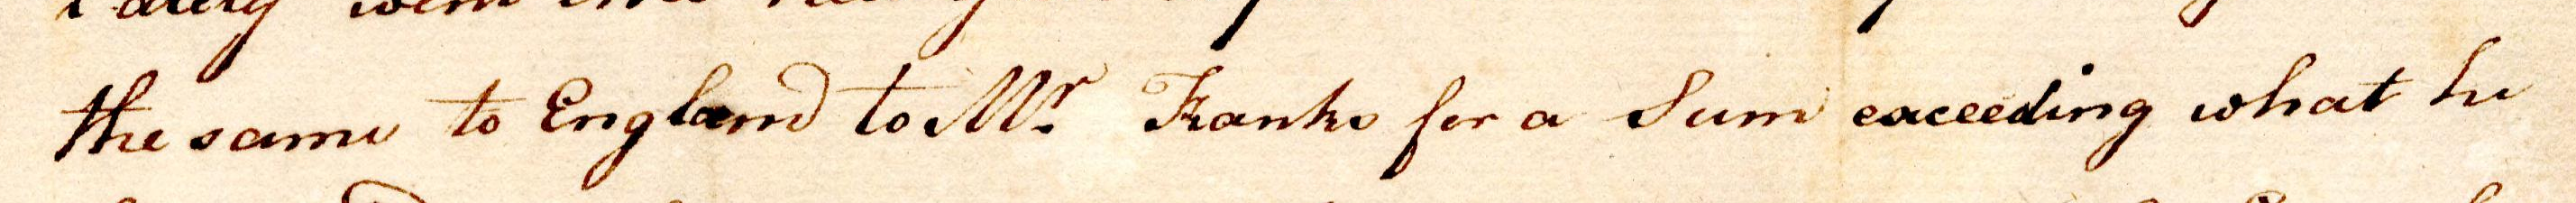the same to England to M^r. Fanke for a Sum exceeding what he
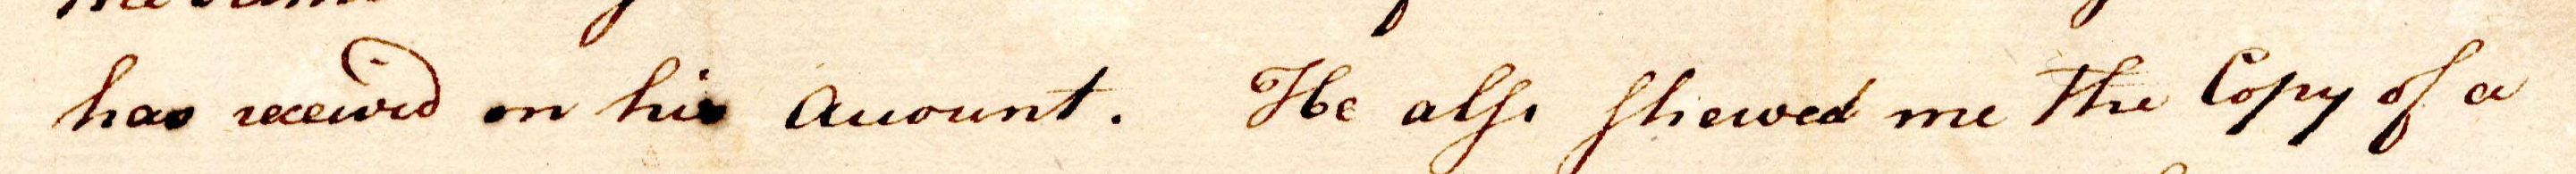has received on his Account. He also showed me the Copy of a
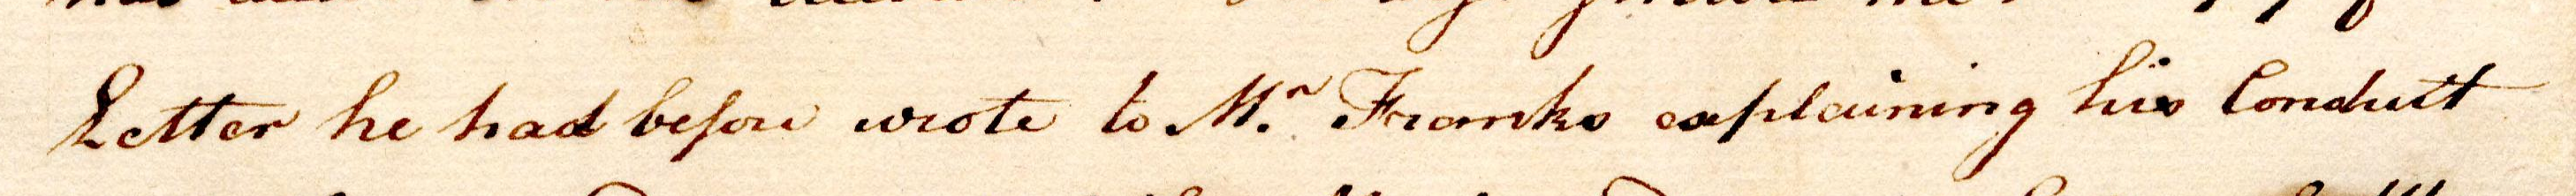Letter he had before wrote to M^r. Franks explaining his Conduct
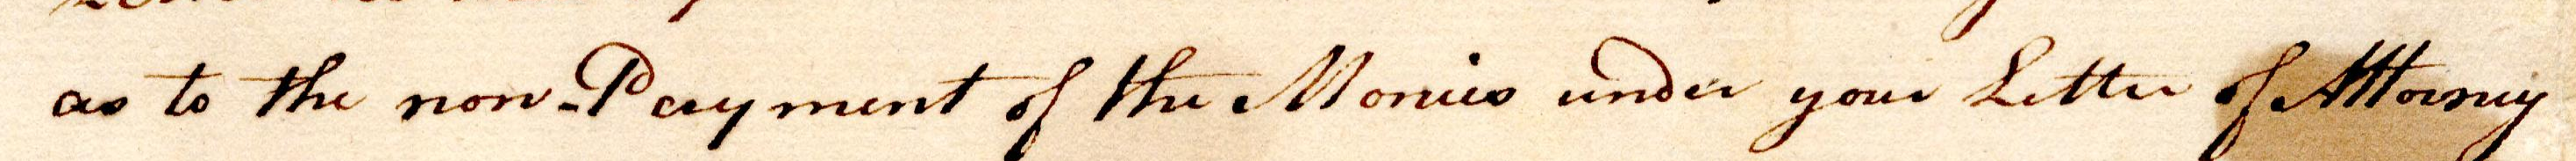as to the now Payment of the Monies under your Letter of Attorney
